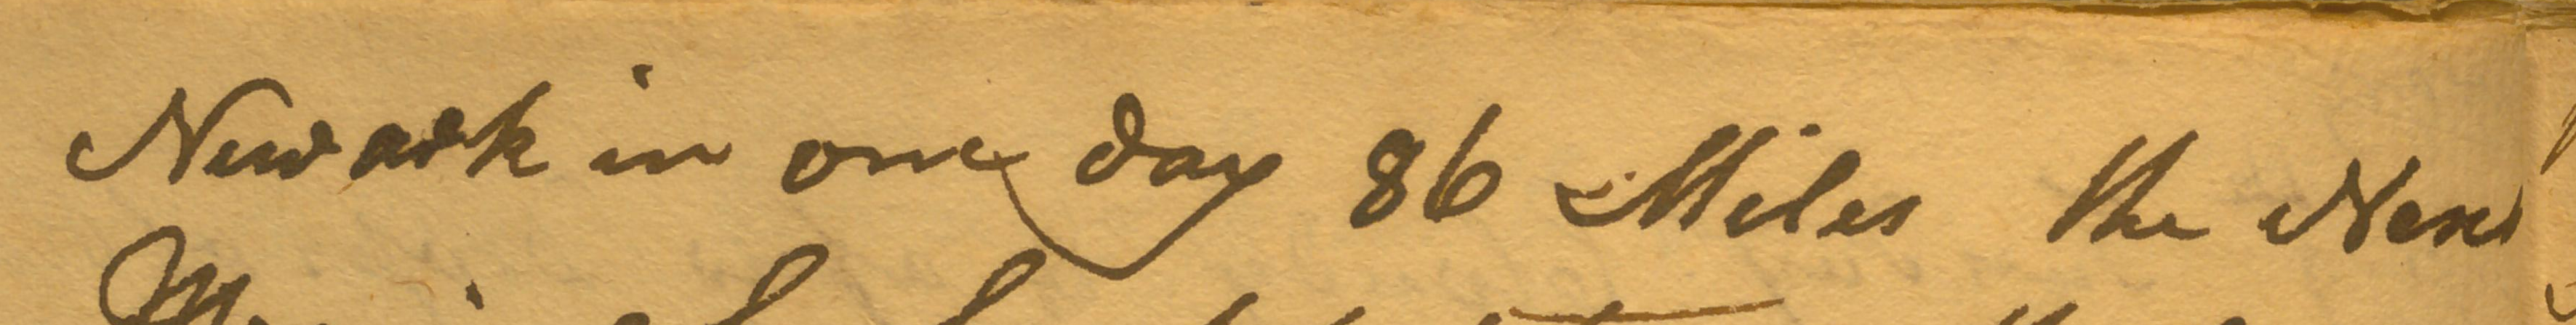Newark in one day 86 Miles the Next
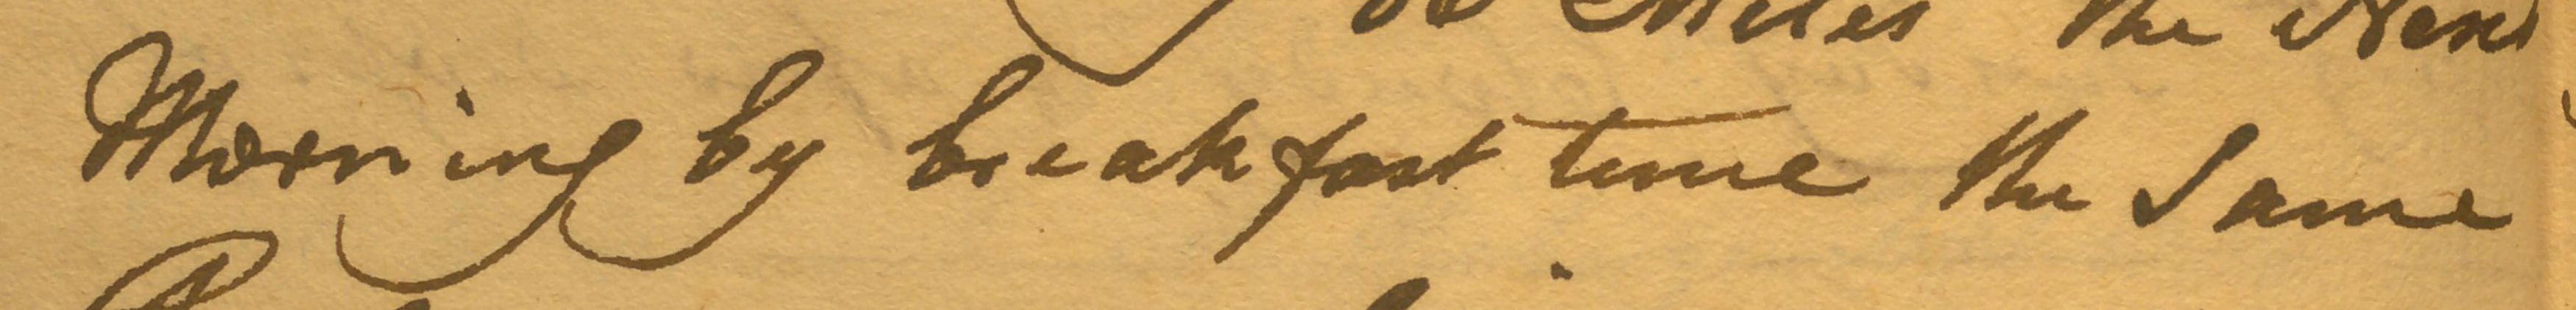Horning by breakfast time the Same
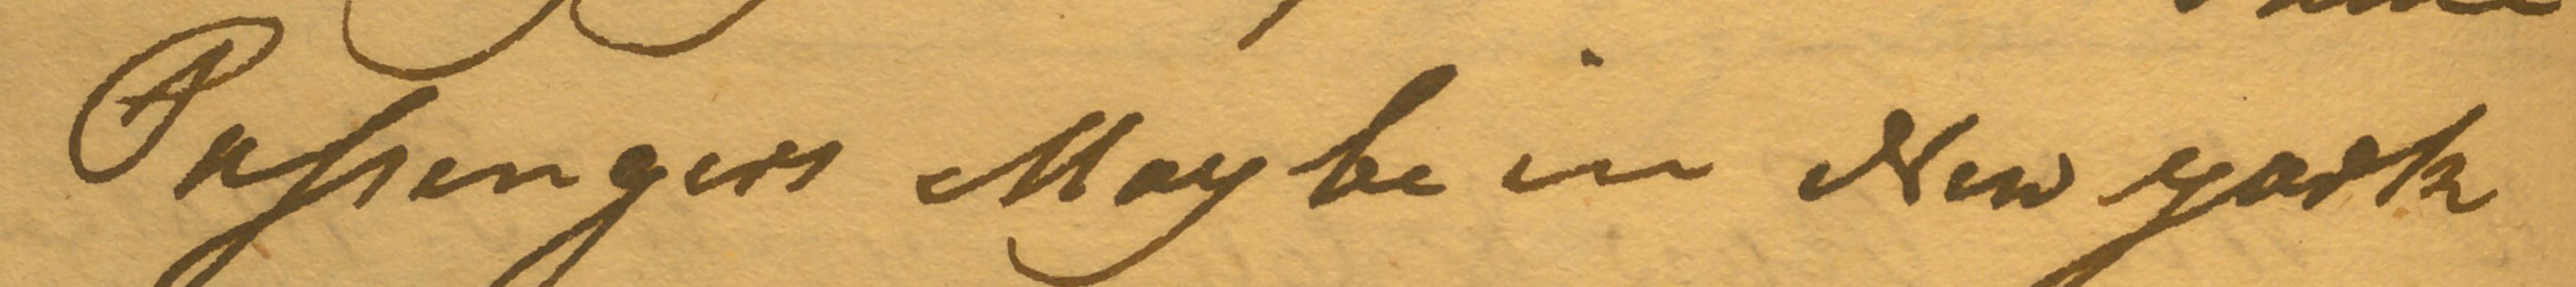Passengers May be in New york
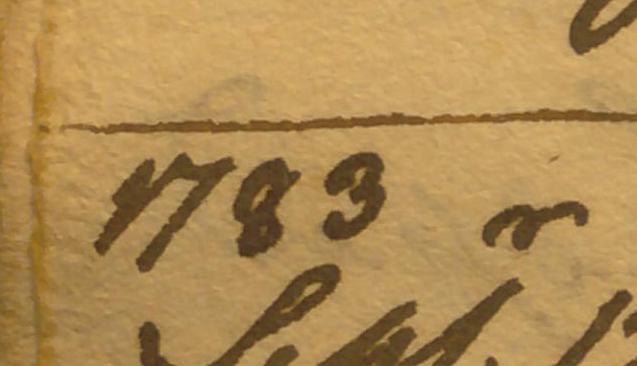1783
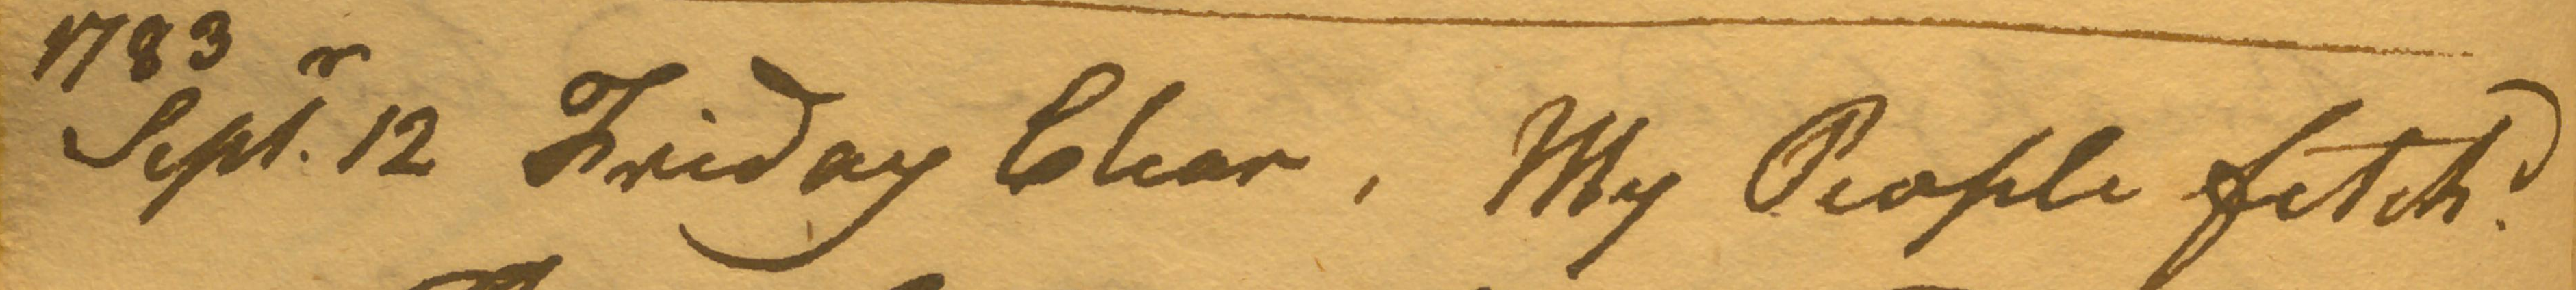Sept^r. 12 Friday Clear. My People fetch^d.
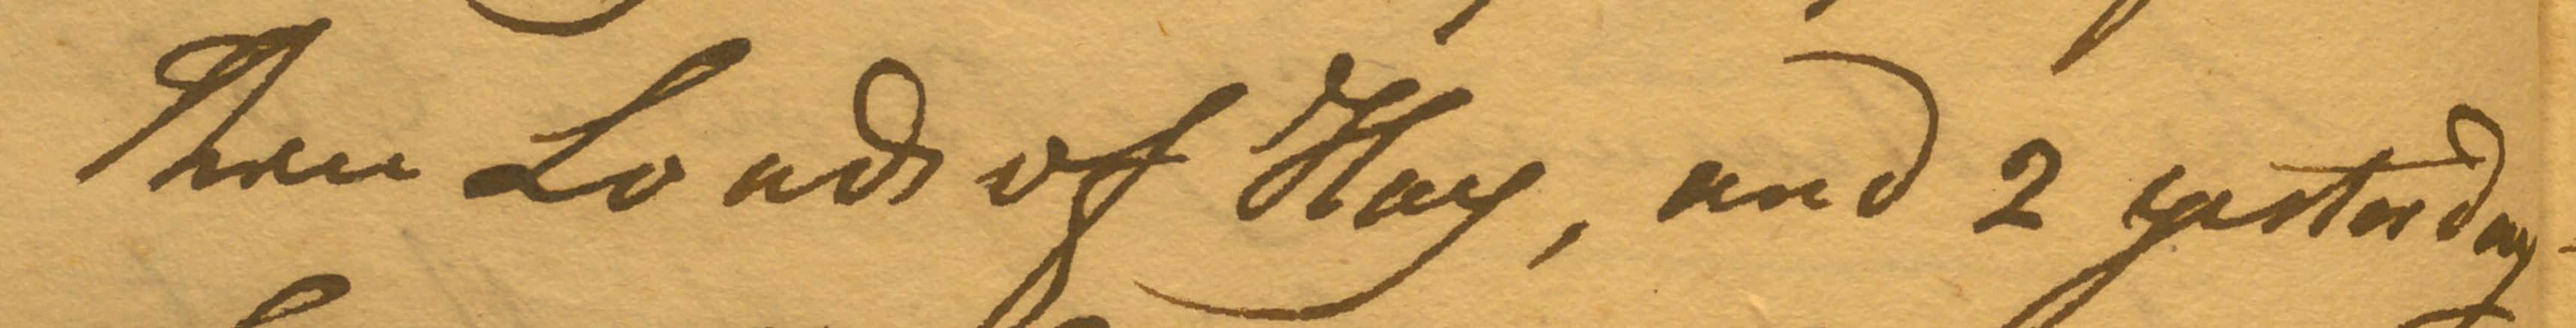Three Loads of Hay, and 2 yesterday
